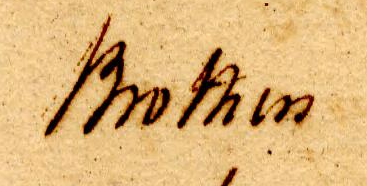Brothers
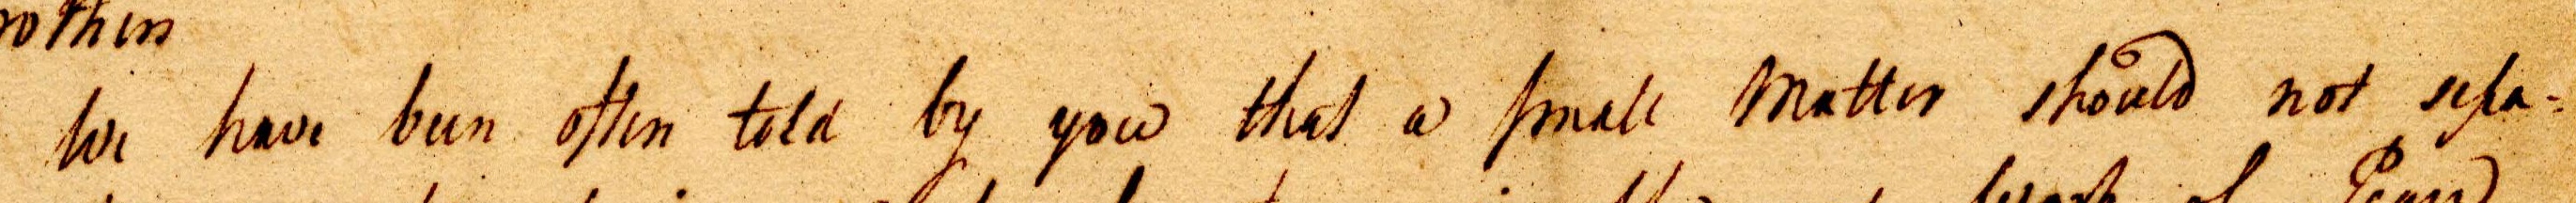We have been often told by you that a small Matter should not sepa-
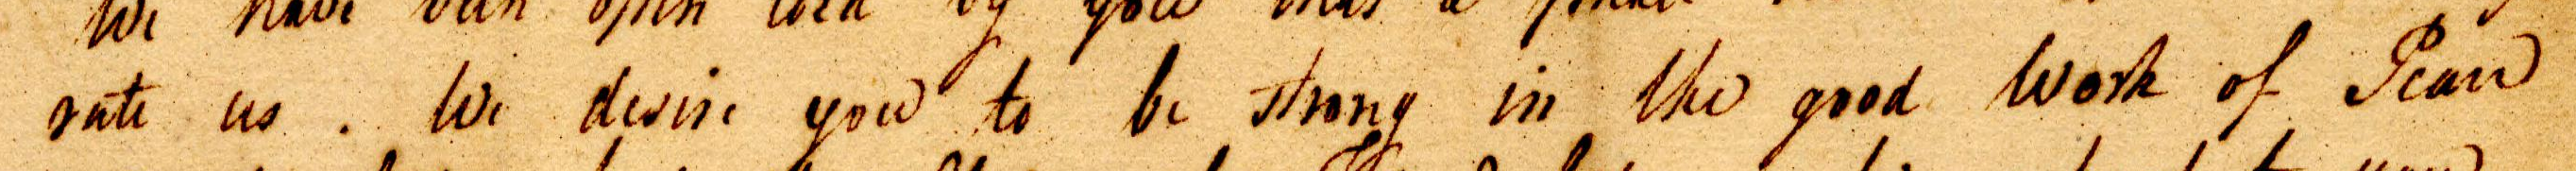rate us. We desire you to be strong in the good Work of Peace
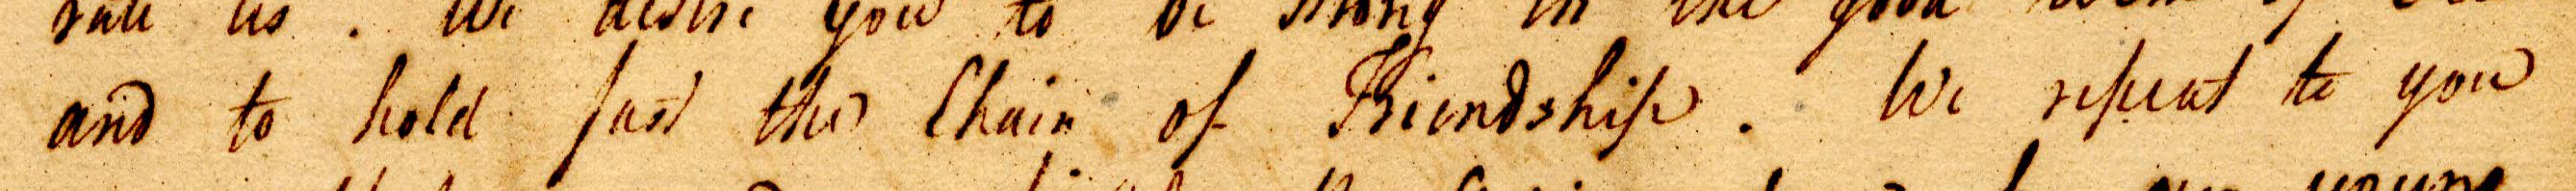and to hold fast the Chain of Friendship. We repeat to you
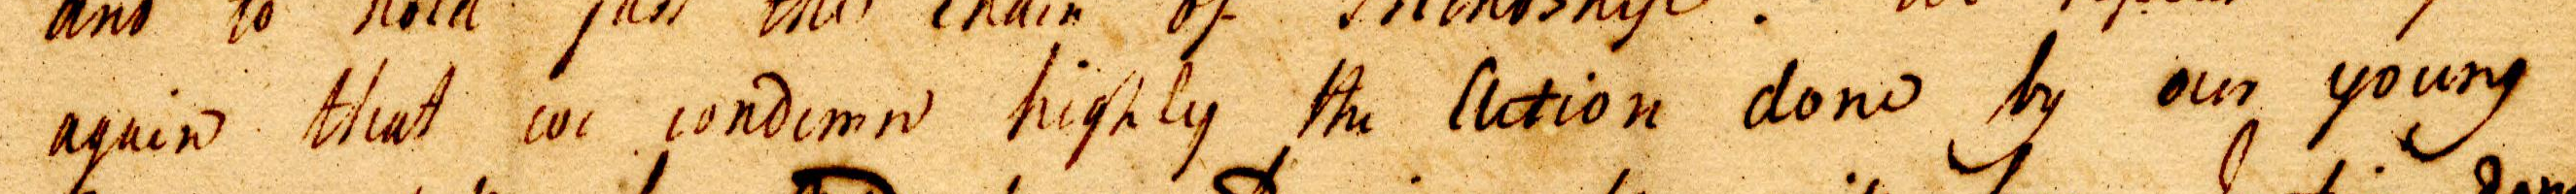again that we condemn highly the Action done by our young
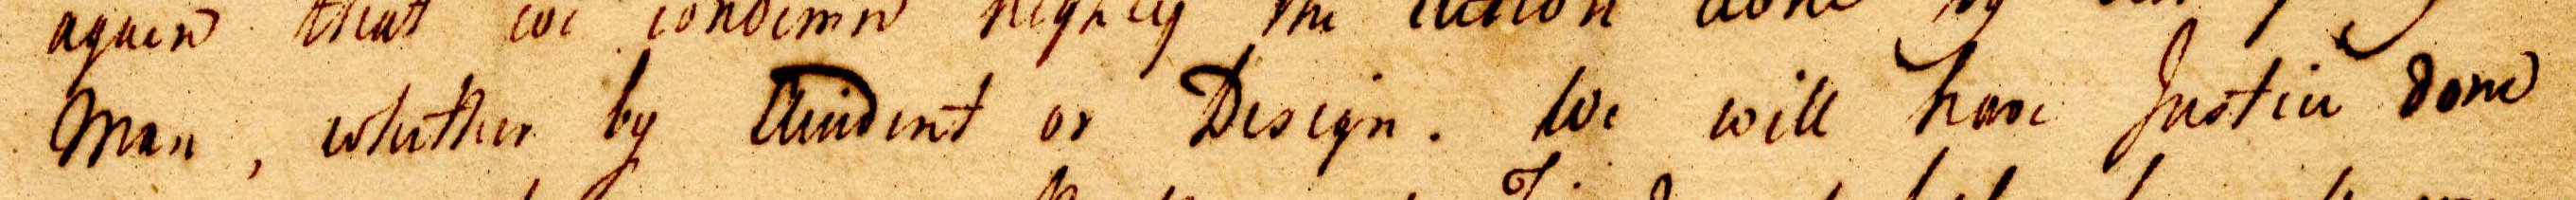Man, whether by Accident or Design. We will have Justice done
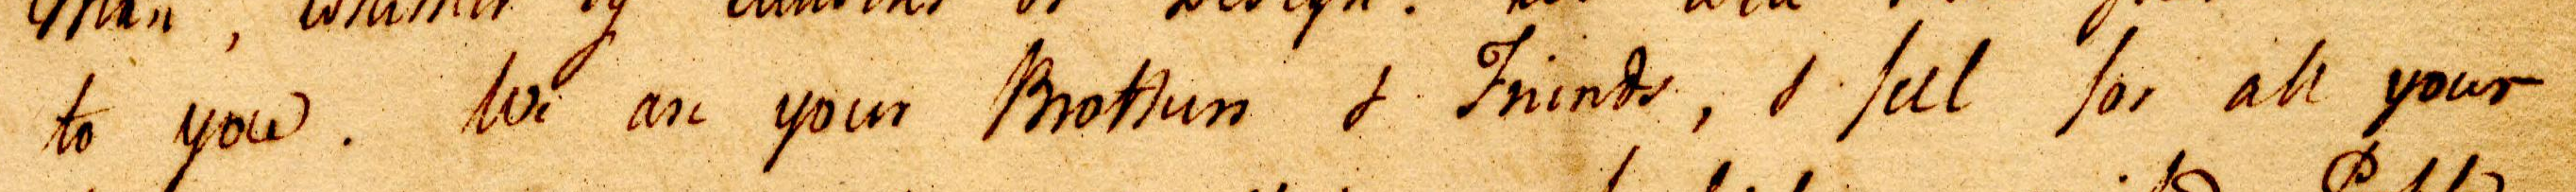to you. We are your Brothers & Friends, & feel for all your
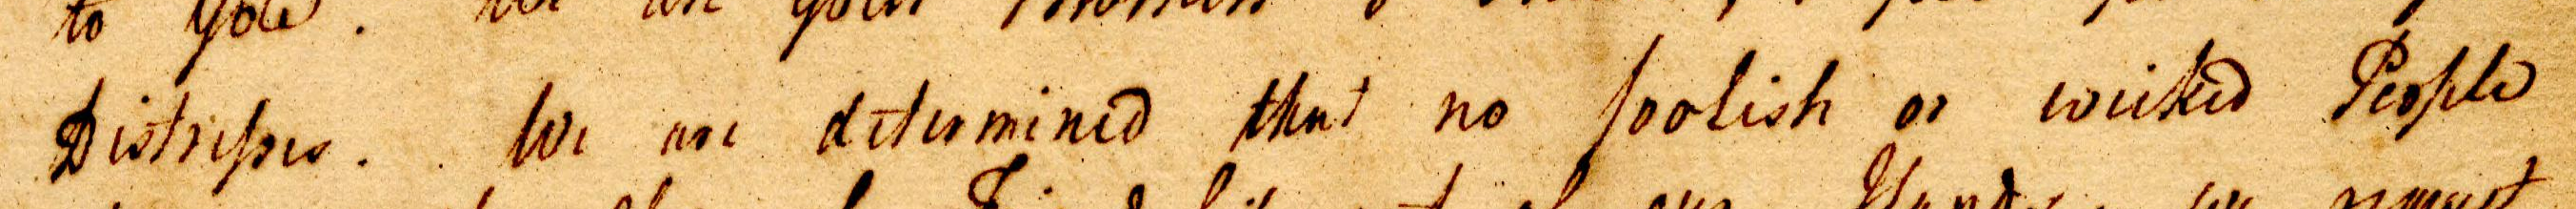Distress. We are determined that no foolish or wicked People
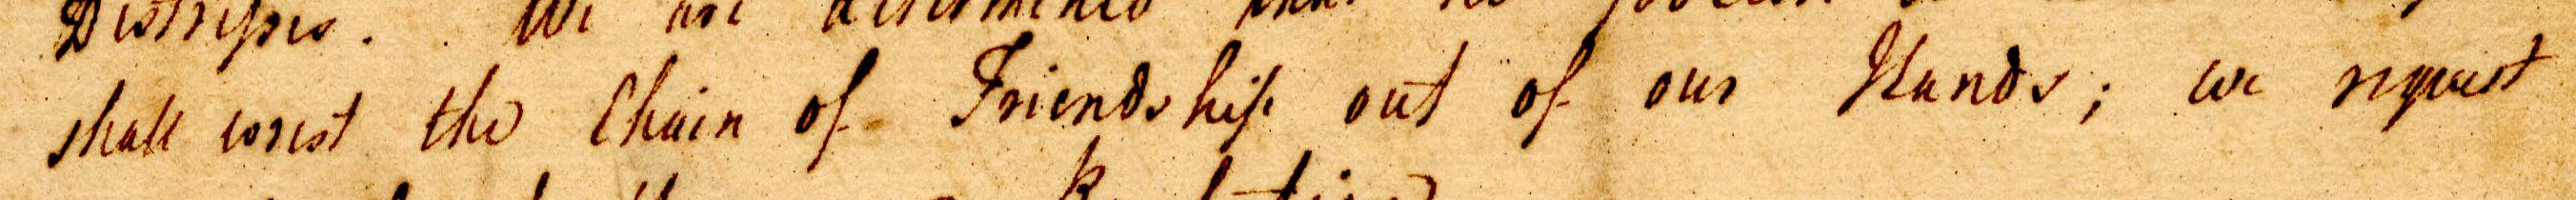shall wrest the Chain of Friendships out of our Hands; we request
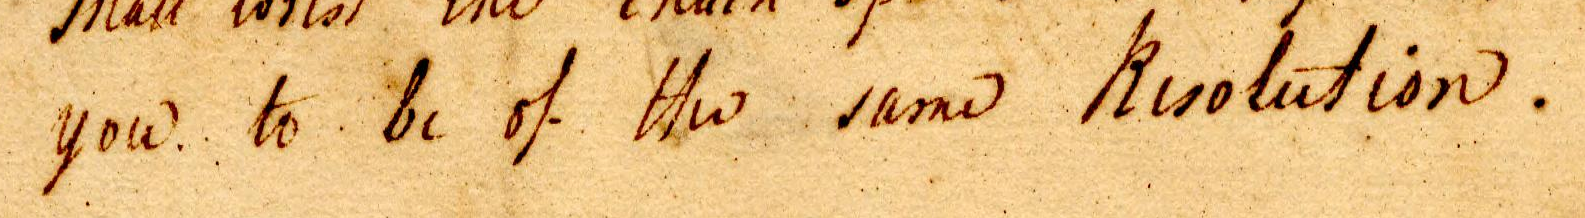you to be of the same Resolution.
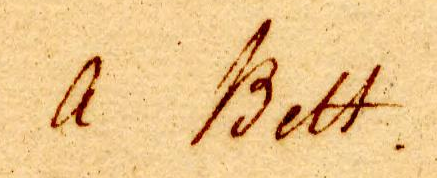A Belt.
